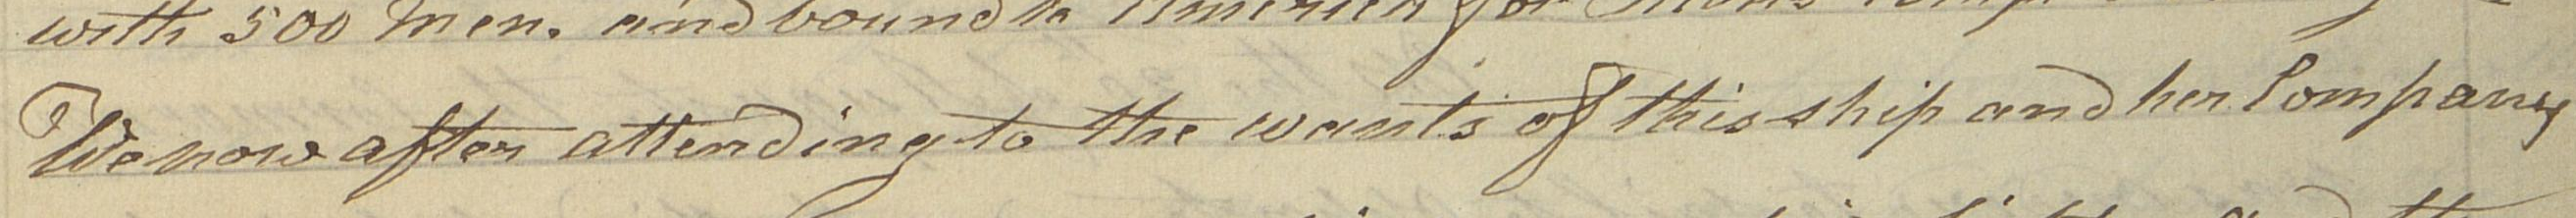We now after attending to the wants of this ship and her Company
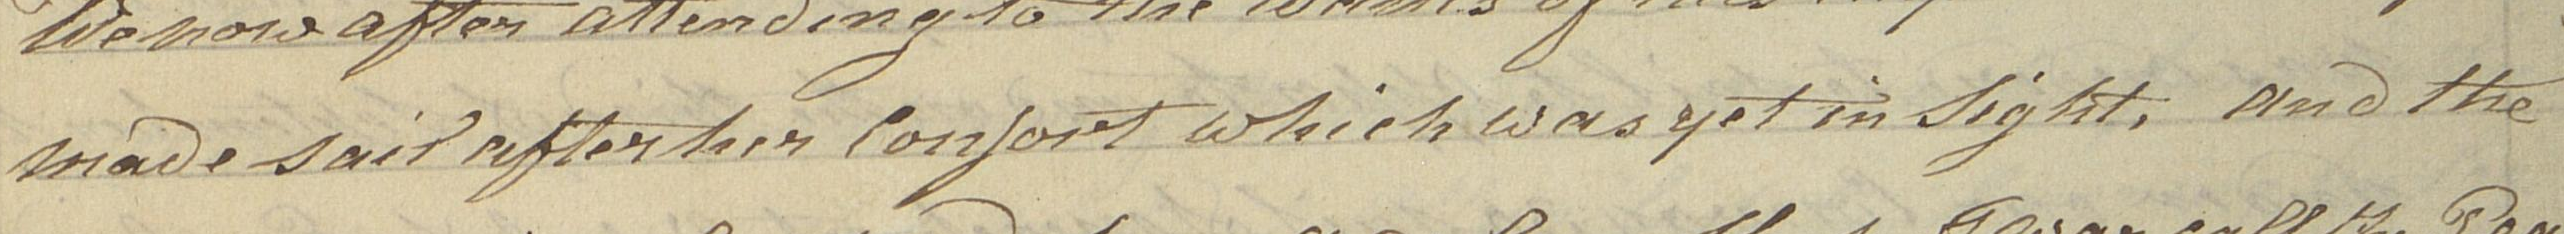made sail after her Consort which was yet in sight, and the
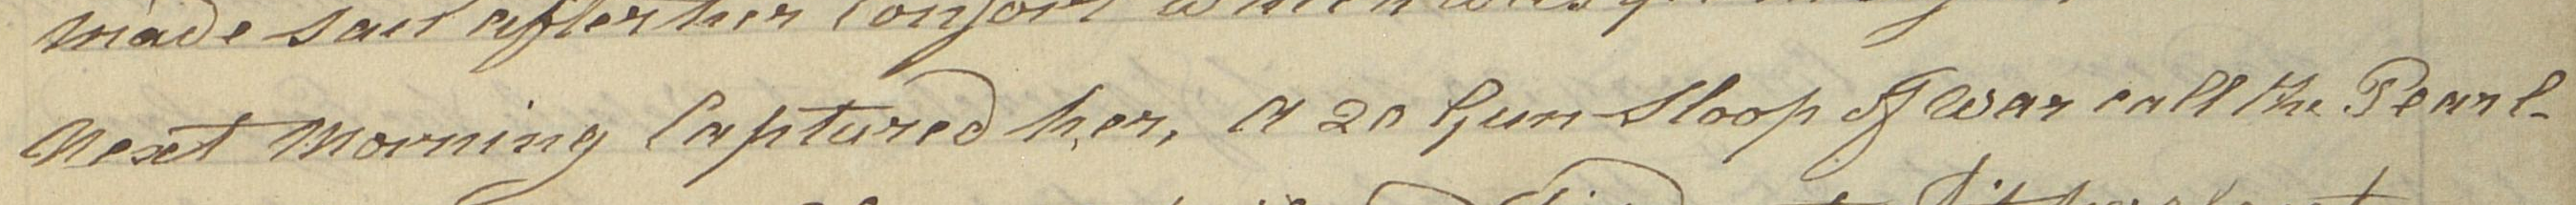Next Morning Captored he, 2 Gum Sloop of war call the Pearl
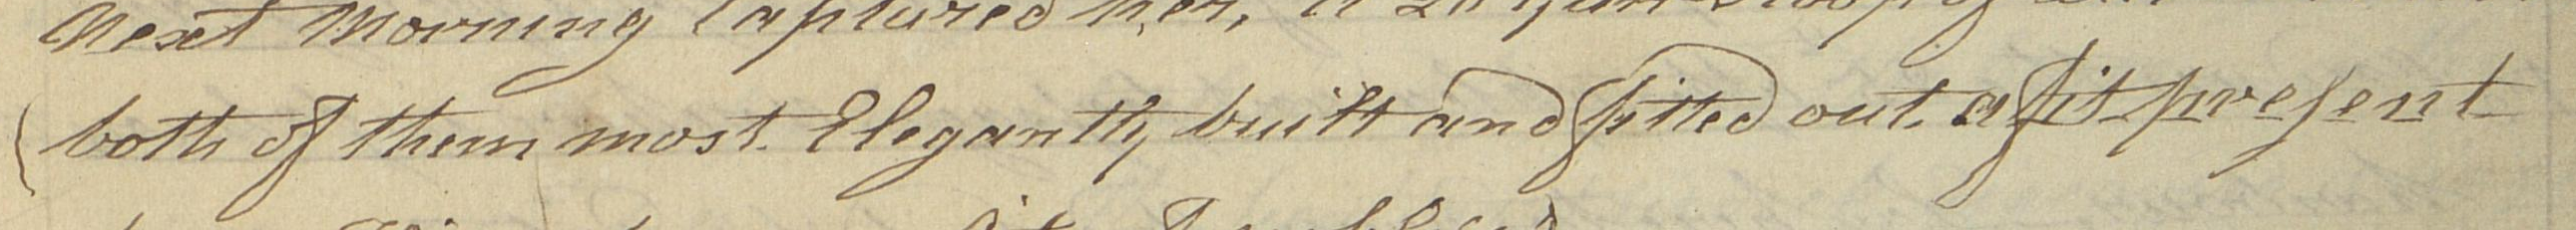(both of them most Elegant, built and fitted out a fit present
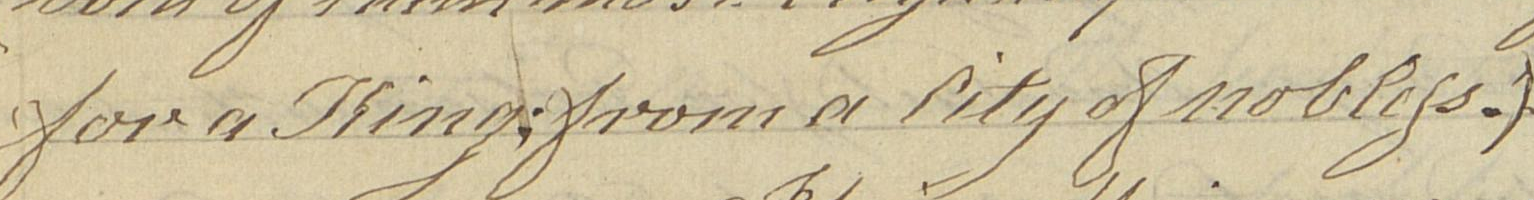for a thing; from a City of nobless.)
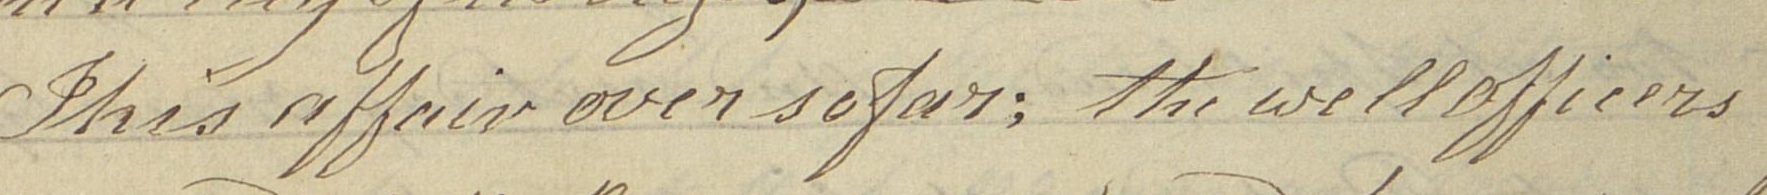This affair over so far; the well officers
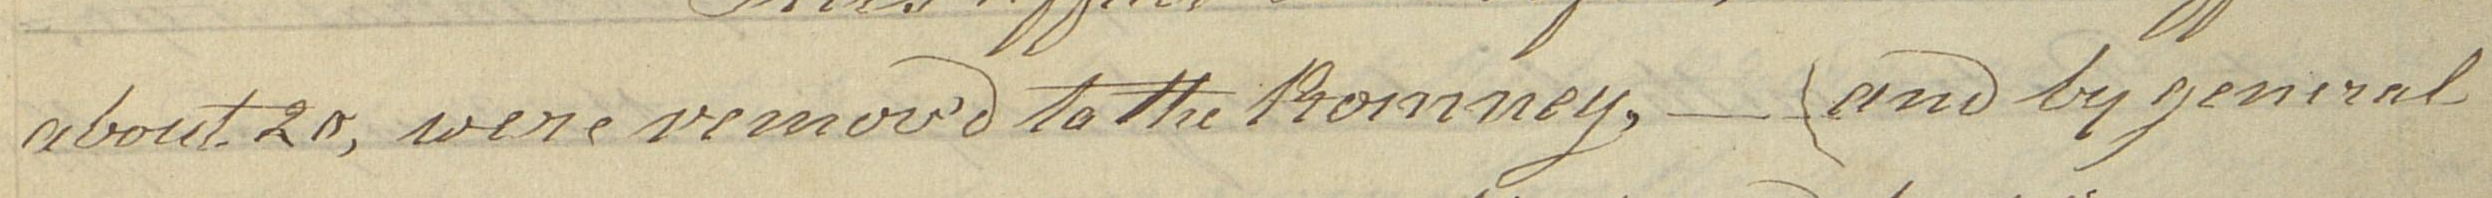about 20, were remov'd to the Romney, (and by general
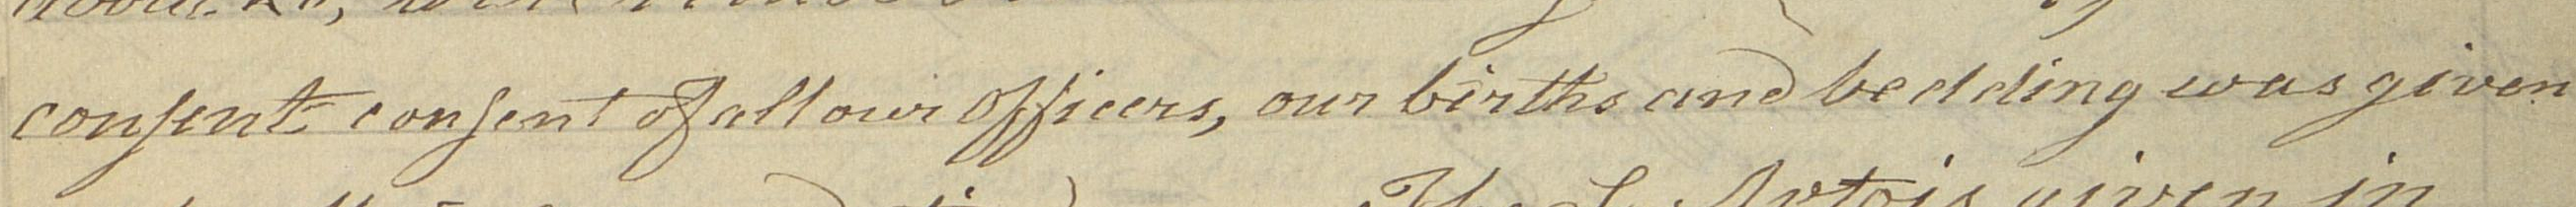consent consent of allow Officers, our births and bedding was given
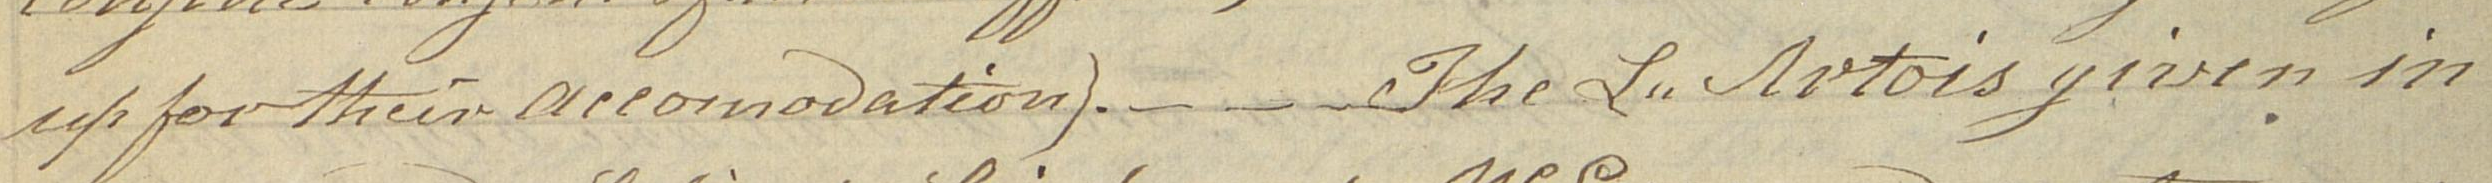up for their accomodation). The L. Artois given in
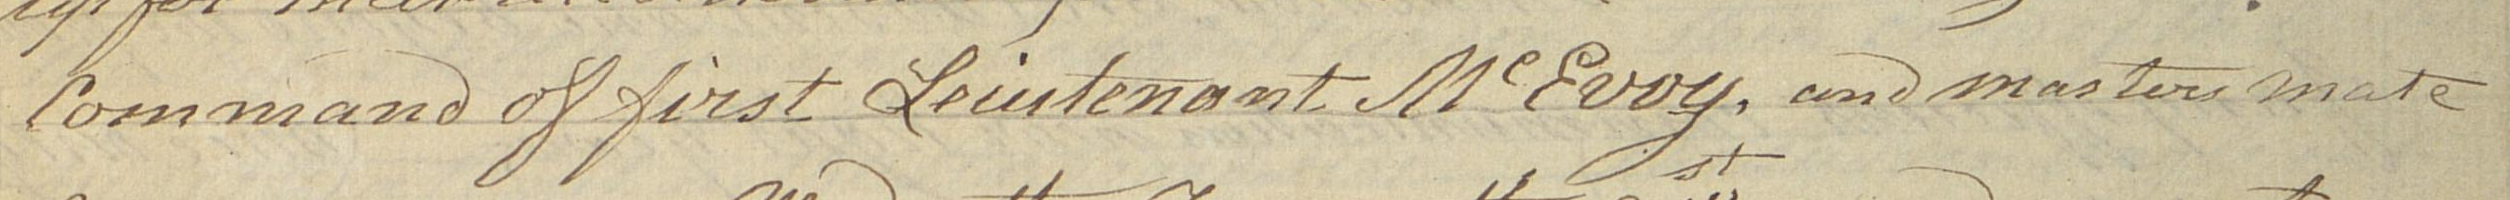Command of first Leiutenant M^cEvoy. and master mate
